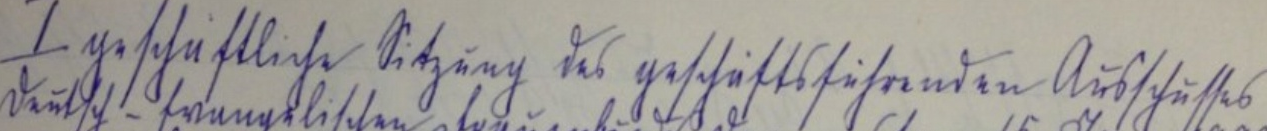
I. geschäftliche Sitzung des geschäftsführenden Ausschusses
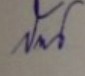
des
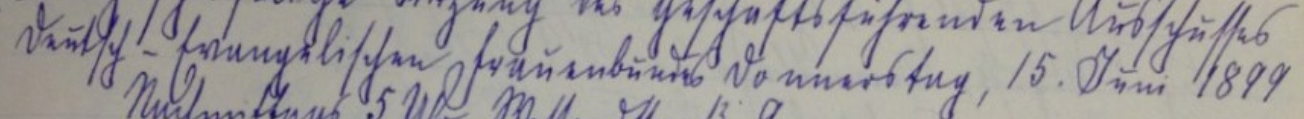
Deutsch-evangelischen Frauenbund Donnerstag, 15. Juni 1899
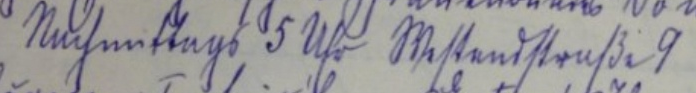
Nachmittags 5 Uhr Westendstraße 9
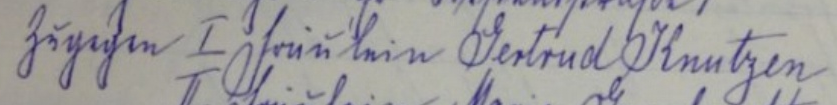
Zugegen: I. Fäulein Gertrud Knutzen
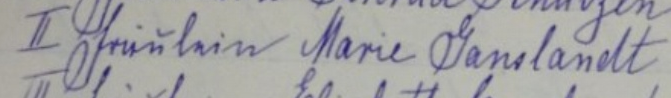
II. Fräulein Marie Ganslandt
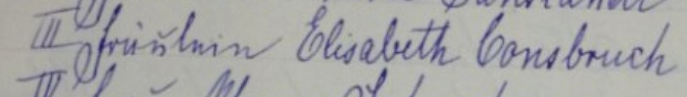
III. Fräulein Elisabeth Consbruck
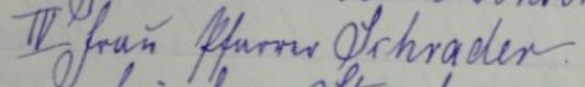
IV Frau Pfarrer Schrader
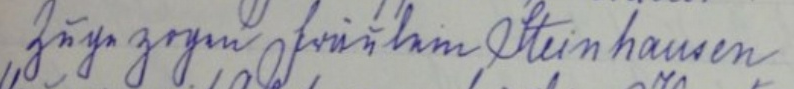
Zugezogen Fräulein Steinhausen
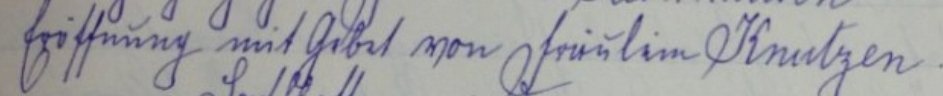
Eröffnung mit Gebet von Fräulein Knutzen
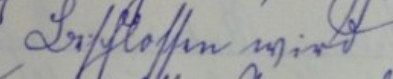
Beschlossen wird
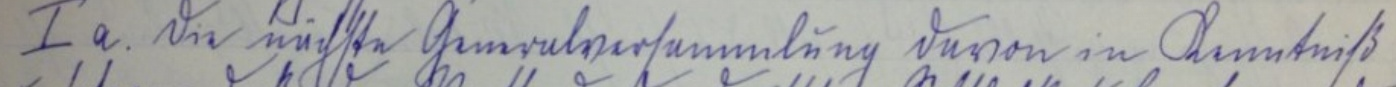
Ia. Die nächste Generalversammlung davon in Kenntnis
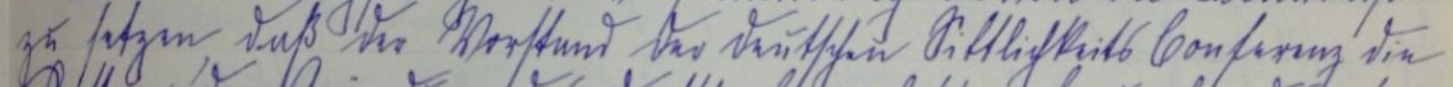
zu setzten, daß der Vorstand der deutschen Sittlichkeits Conferenz die
